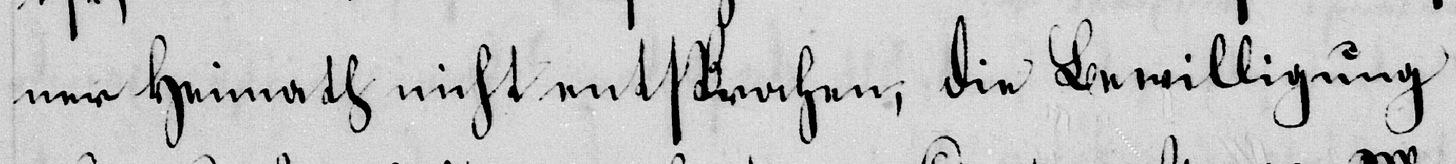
ner Heimath nicht entsprochen, die Bewilligung
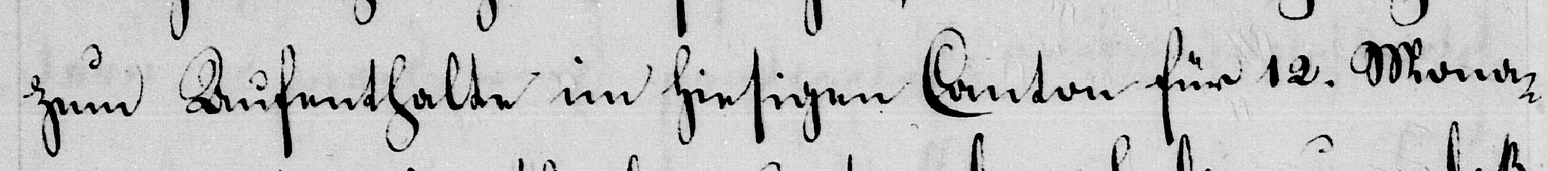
zum Aufenthalte im hiesigen Canton für 12. Mona¬
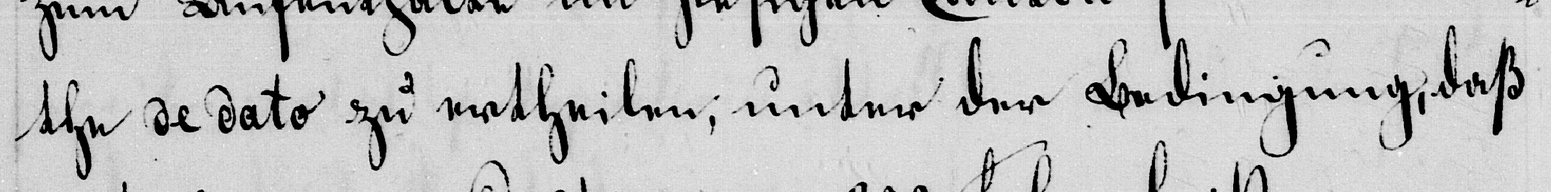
the de dato zu ertheilen, unter der Bedingung, daß
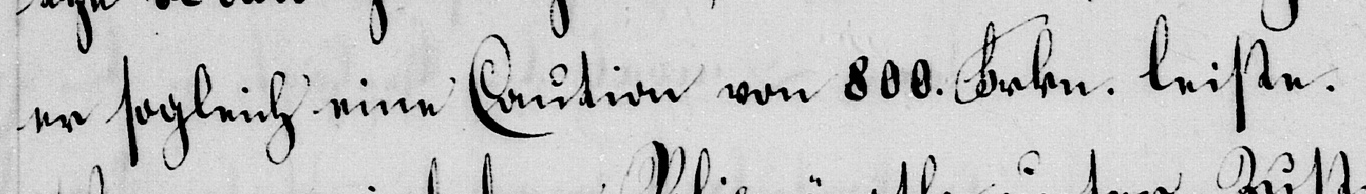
er sogleich eine Caution von 800. Frkn. leiste.
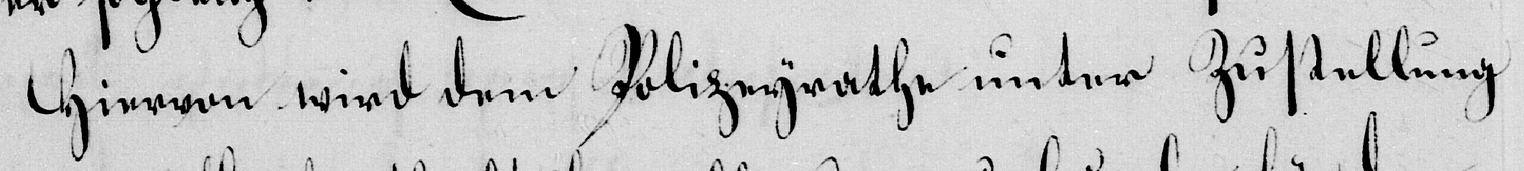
Hiervon wird dem Polizeyrathe unter Zustellung
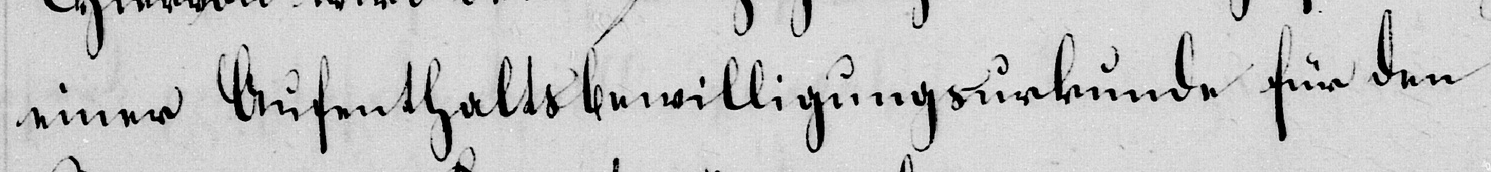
einer Aufenthaltsbewilligungsurkunde für den
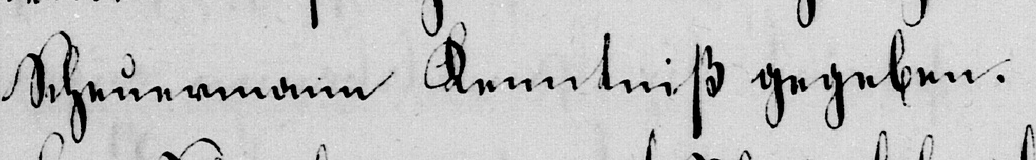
Scheuermann Kenntniß gegeben.
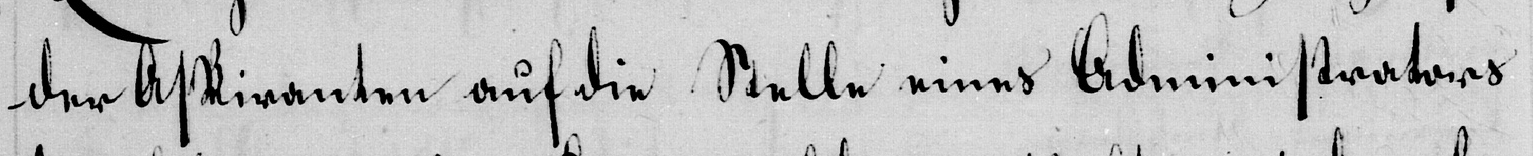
der Aspiranten auf die Stelle eines Administrators
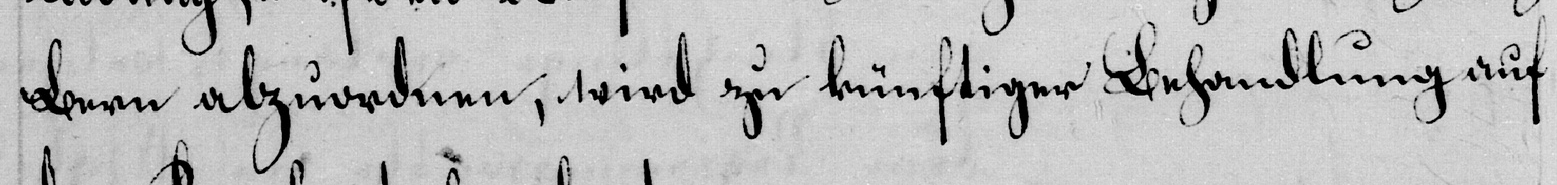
Bern abzuordnen, wird zu künftiger Behandlung auf
